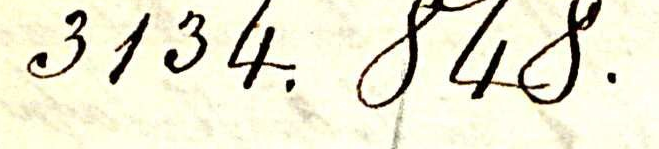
3134. 848.
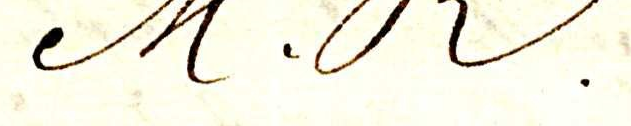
M. R.
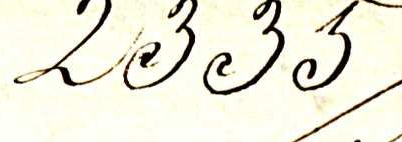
2335
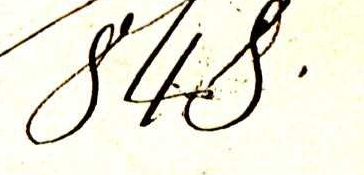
848.
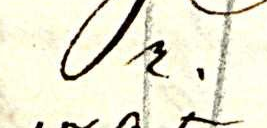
Sr.
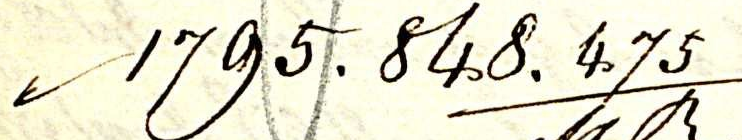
1795. 848. 475
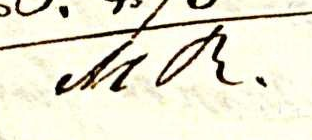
M R.
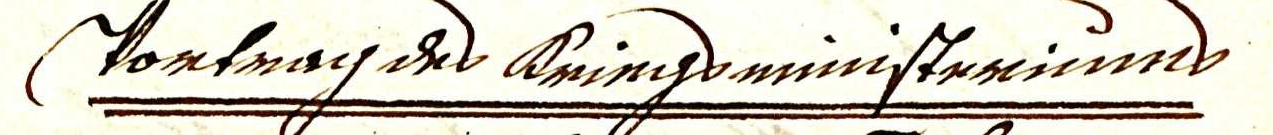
Vortrag des Kriegsministeriums
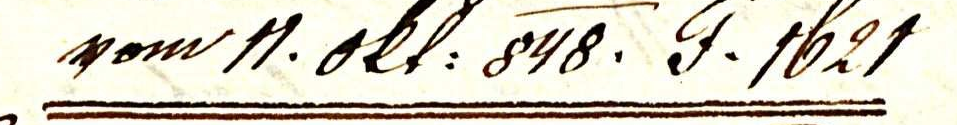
vom 11. Okt: 848. F. 1621
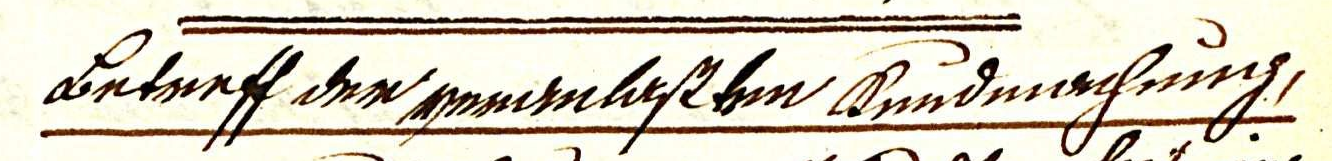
Betreff der veranlaßten Kundmachung,
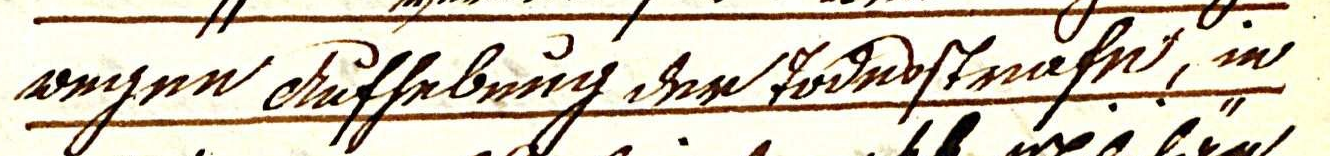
wegen Aufhebung der Todesstrafe, in
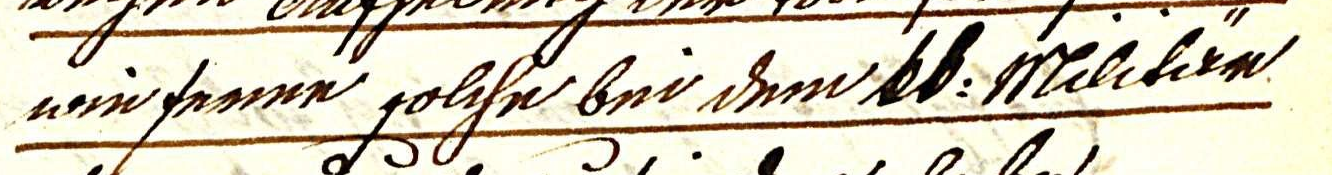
wie ferne solche bei dem kk: Militär
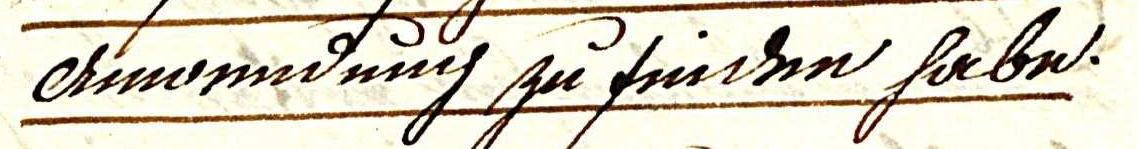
Anwendung zu finden habe.
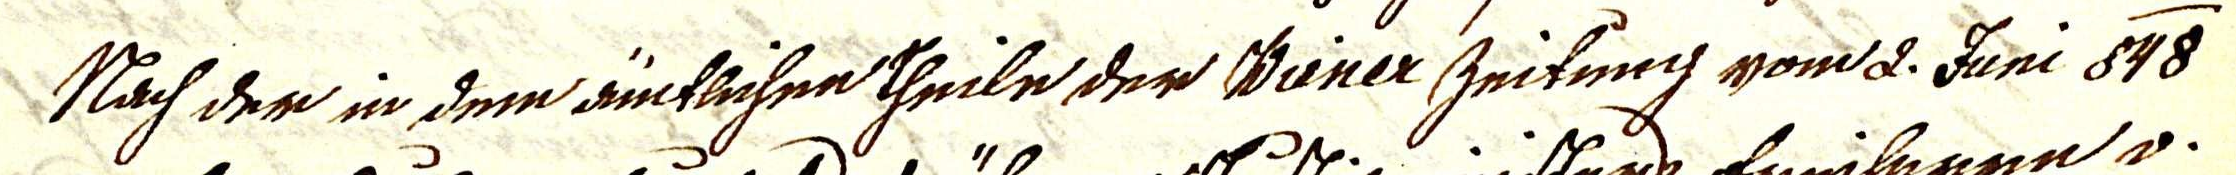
Nach der in der ämtlichen Theile der Wiener Zeitung vom 2. Juni 848
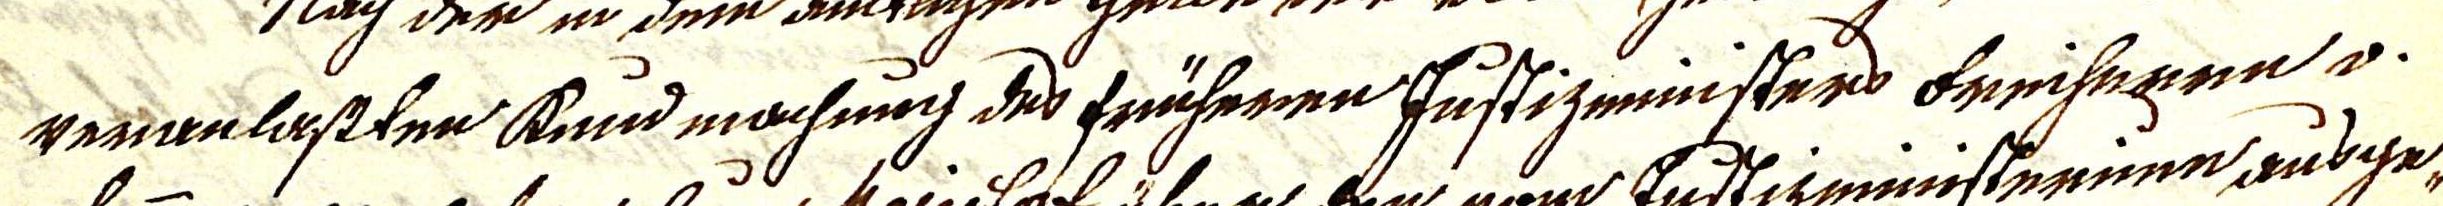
veranlaßter Kundmachung des früherer Justizministers Breiherrn v.
